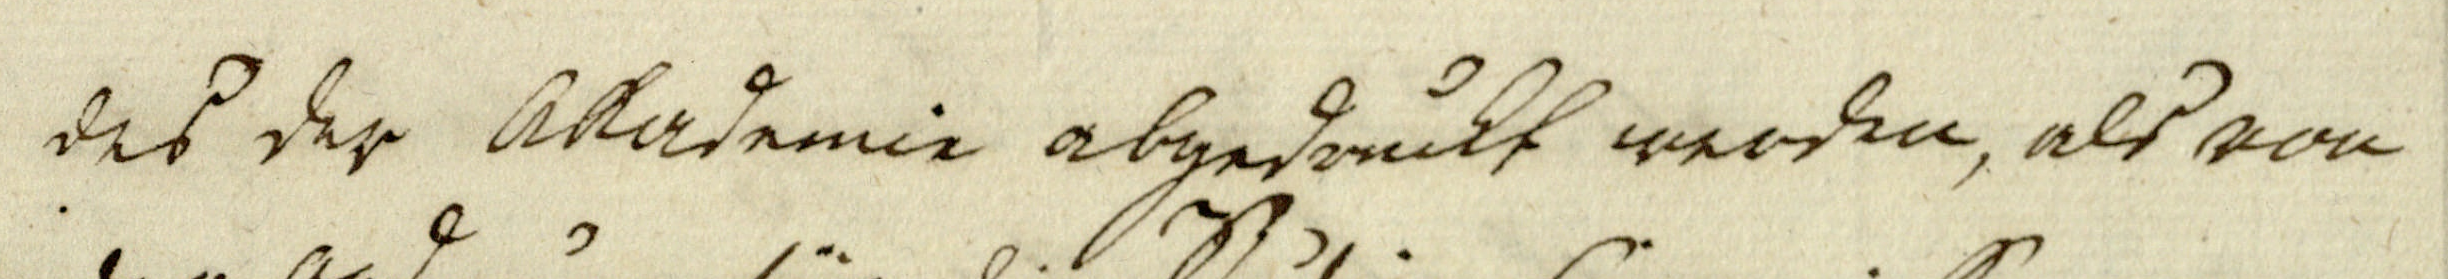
des der Akademie abgedruckt werden, als von
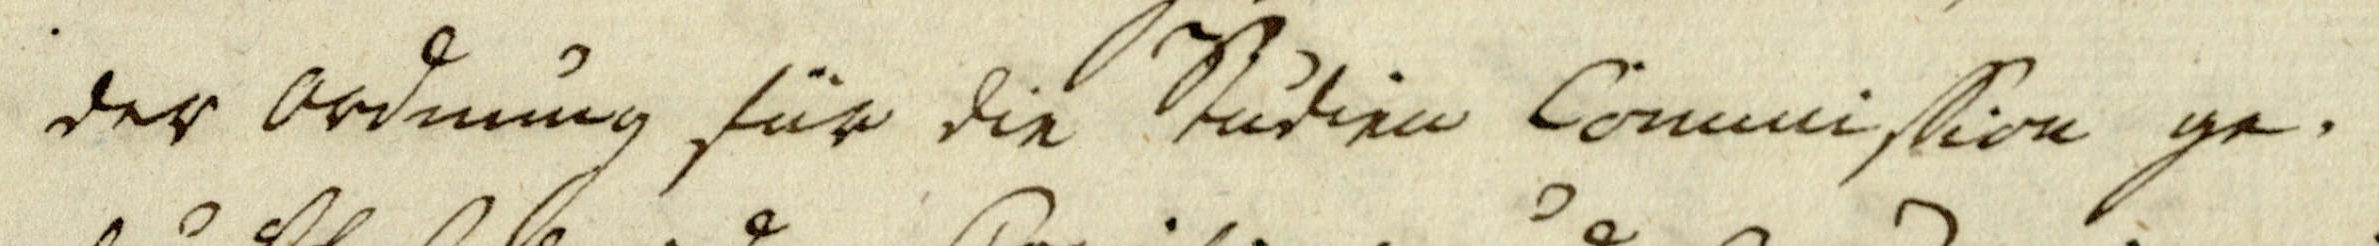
der Ordnung für die Studien Commission ge¬
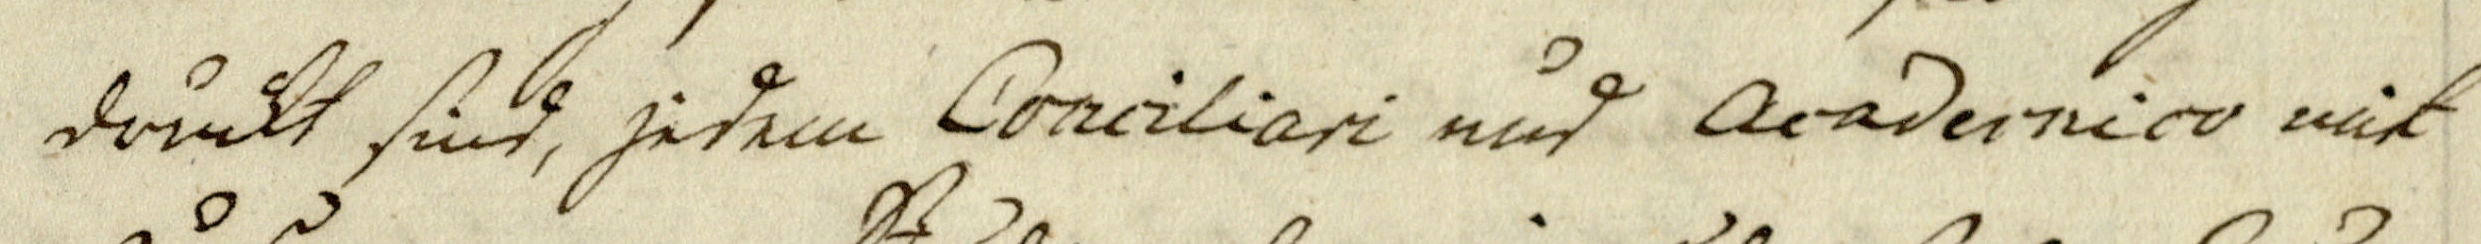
druckt sind, jedem Conciliari und Academico mit
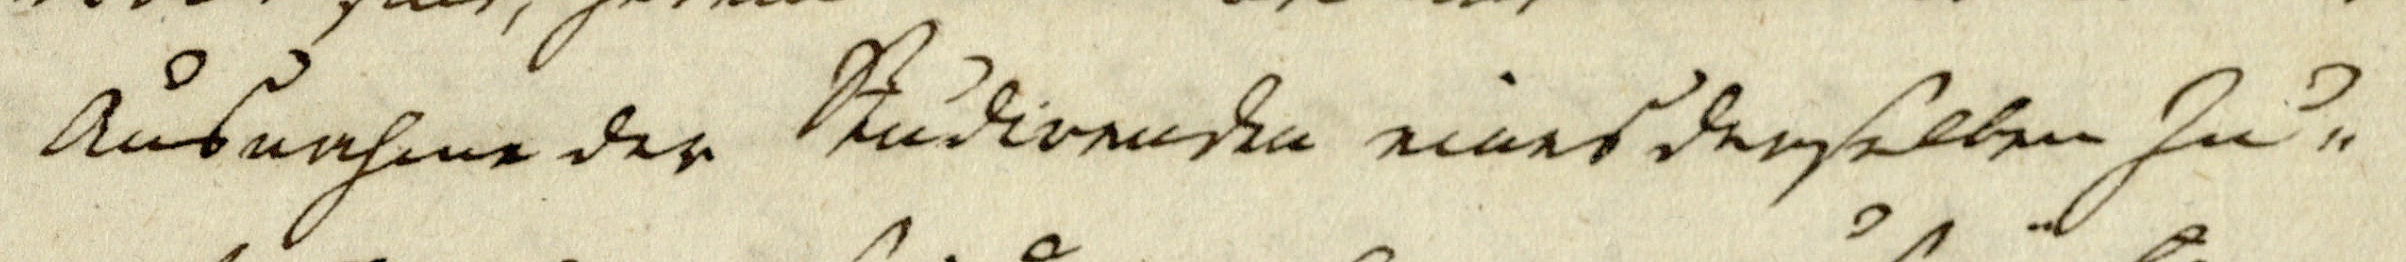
Ausnahme der Studirenden eines derselben zu¬
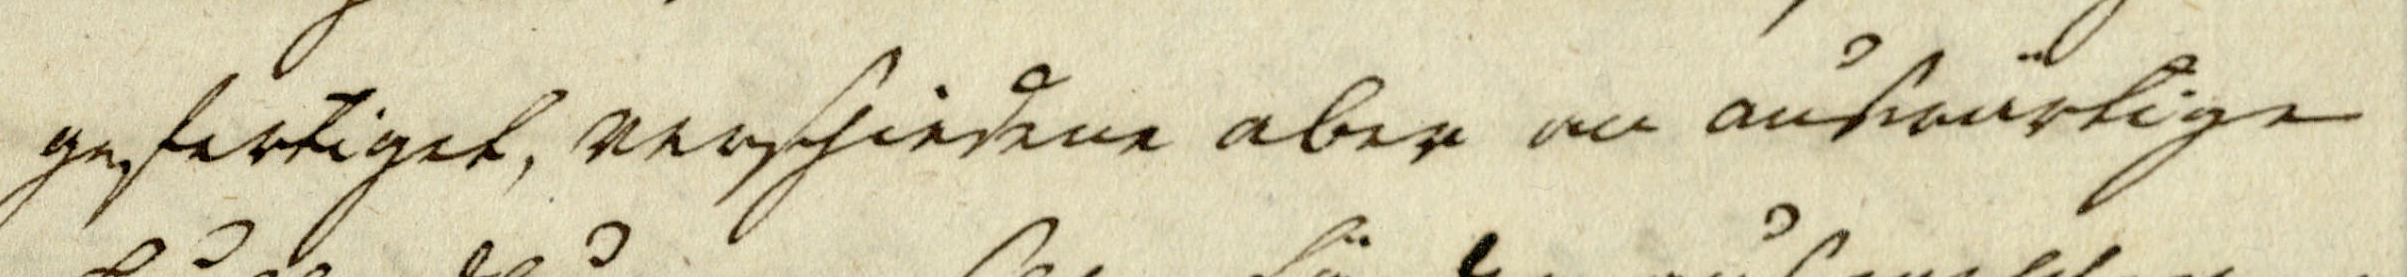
gefertiget, verschiedene aber an auswärtige
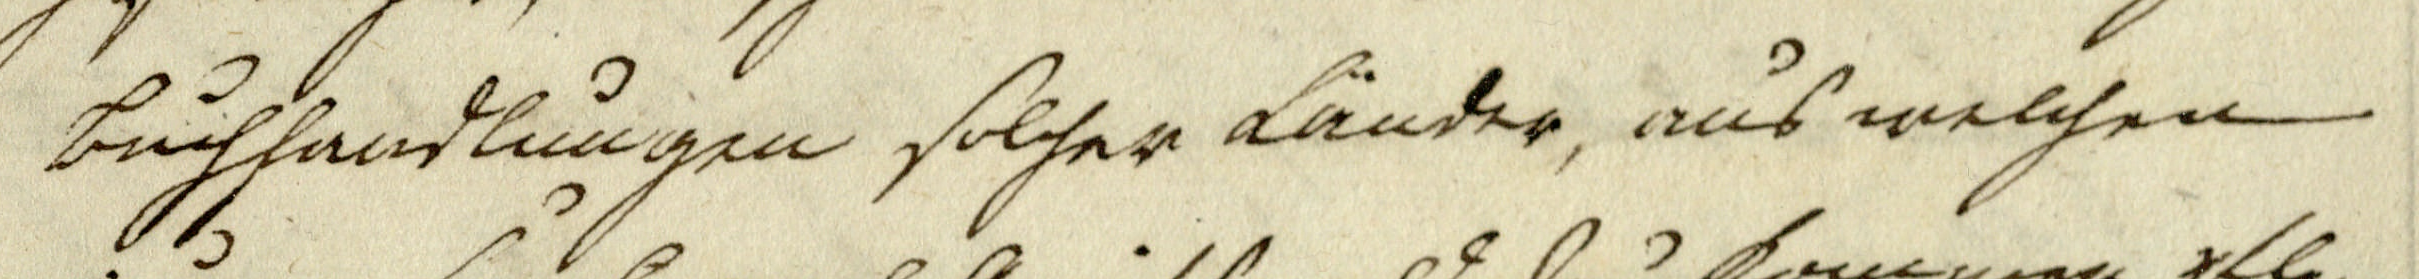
Buchhandlungen solcher Länder, aus welchen
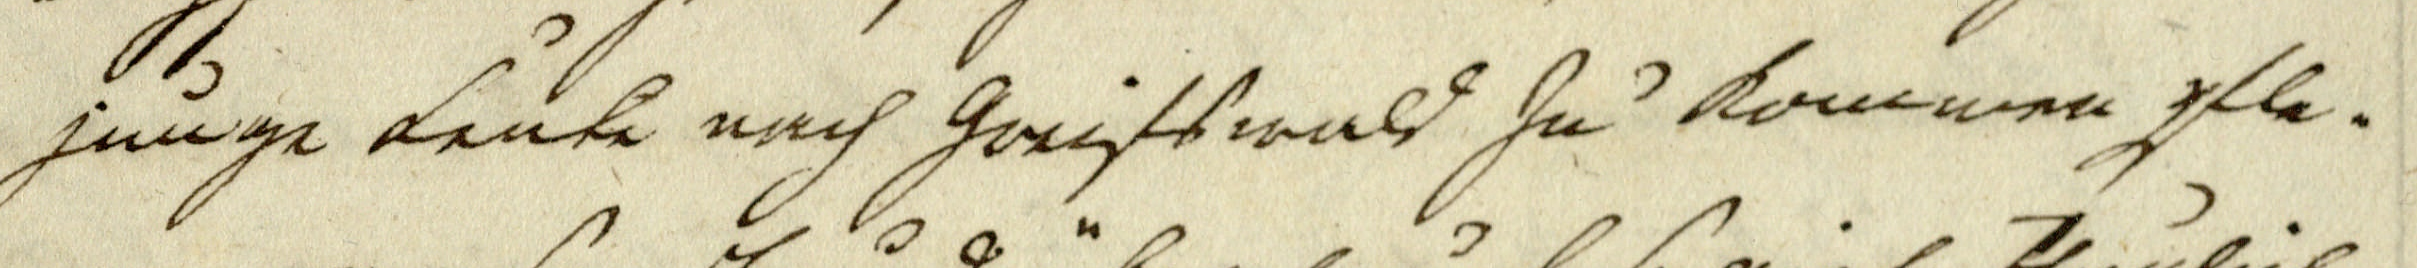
junge Leute nach Greifswald zu kommen pfle¬
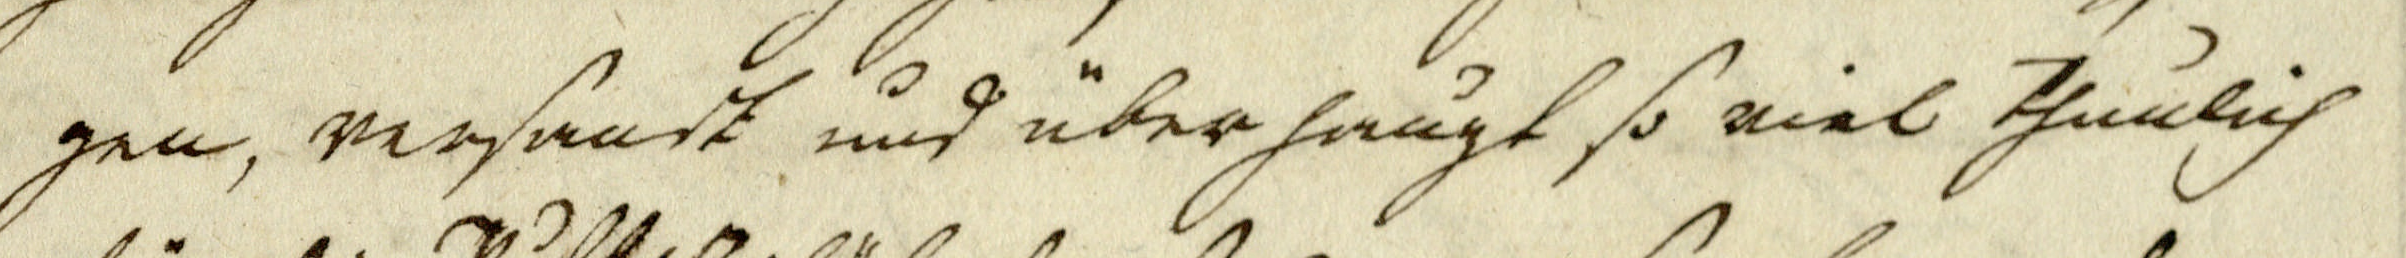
gen, versandt und überhaupt so viel thunlich
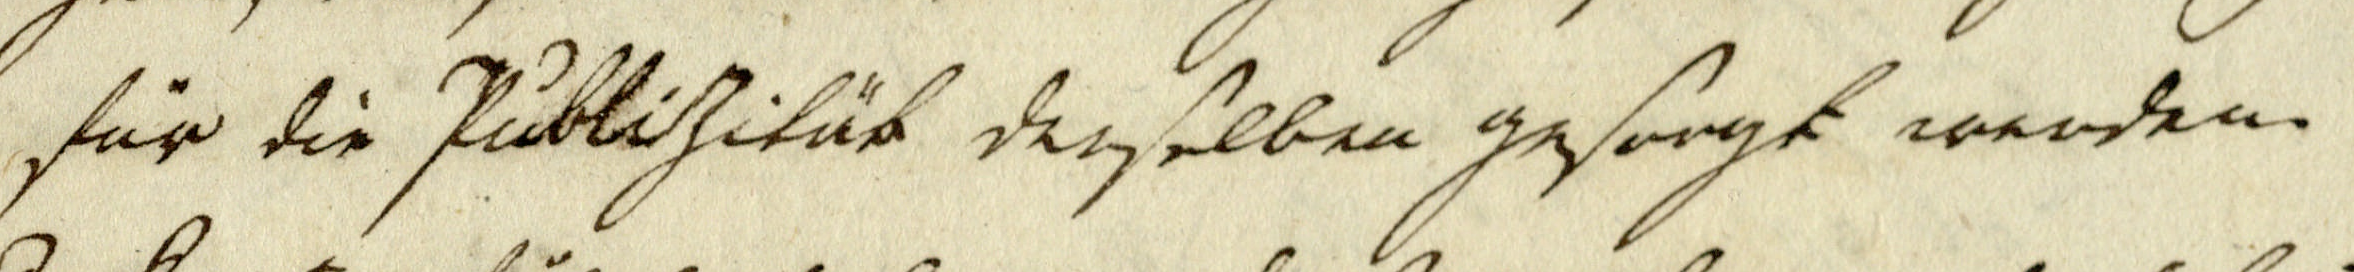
für die Publizität derselben gesorgt werden.
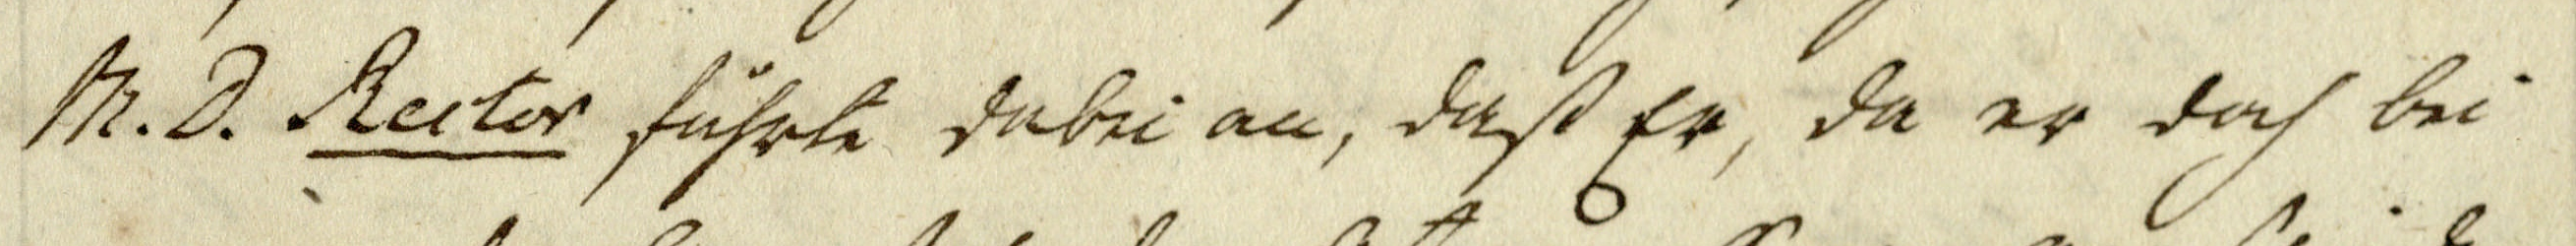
M. D. Rector führte dabei an, daß Er, da er doch bei
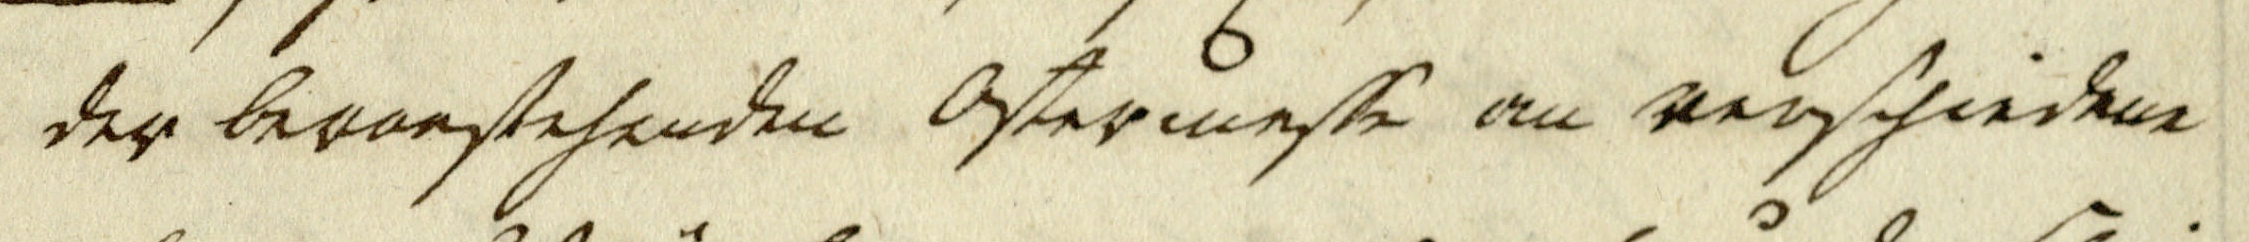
der bevorstehenden Ostermesse an verschiedene
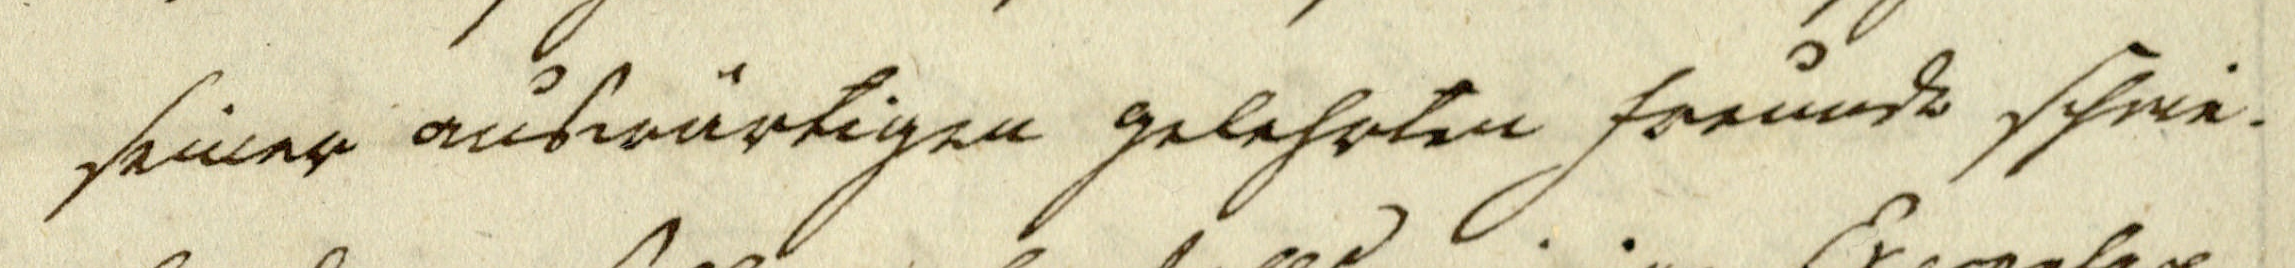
seiner auswärtigen gelehrten Freunde schrie¬
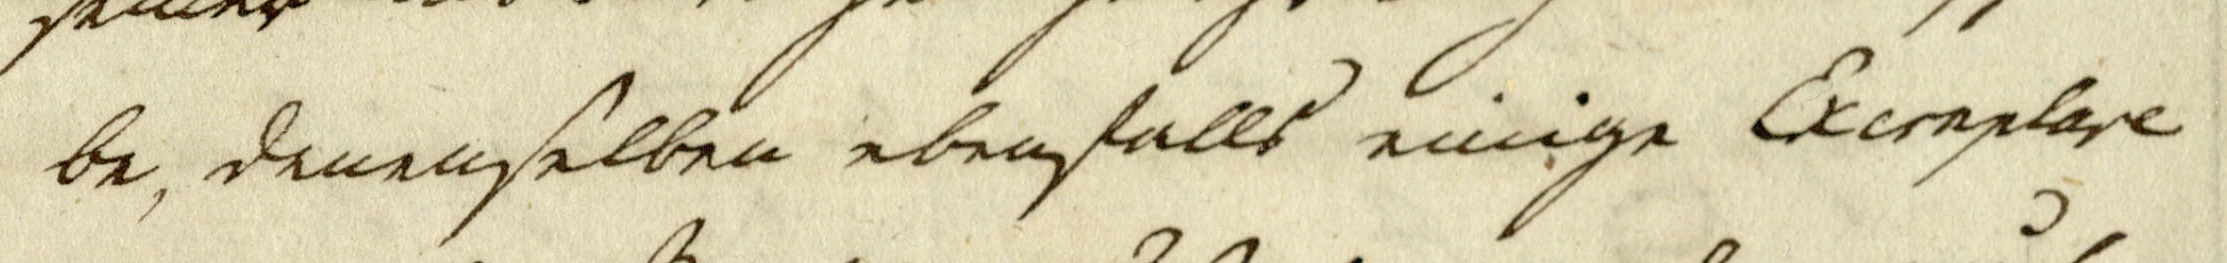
be, denenselben ebenfalls einige Exemplare
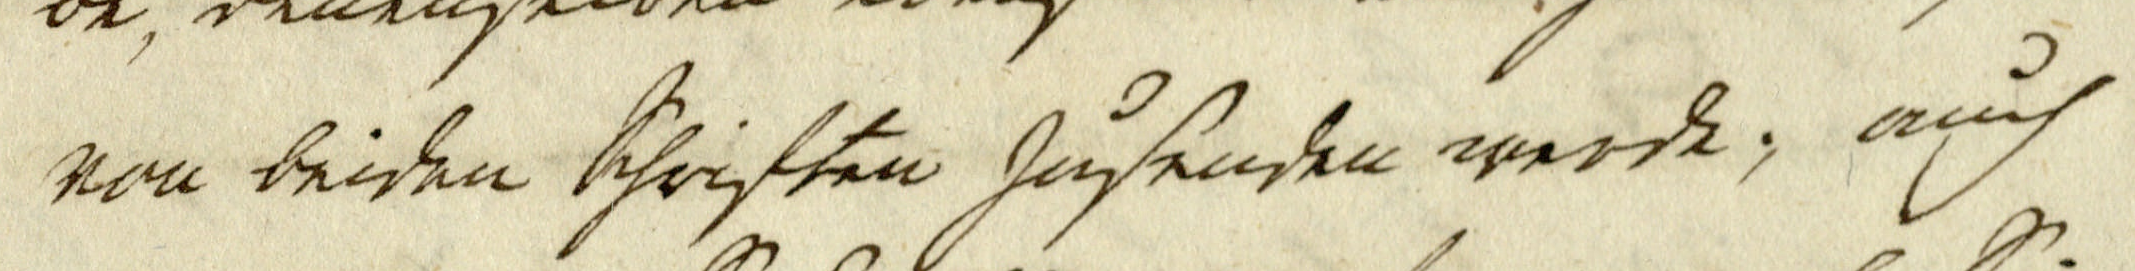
von beiden Schriften zusenden werde; auch
